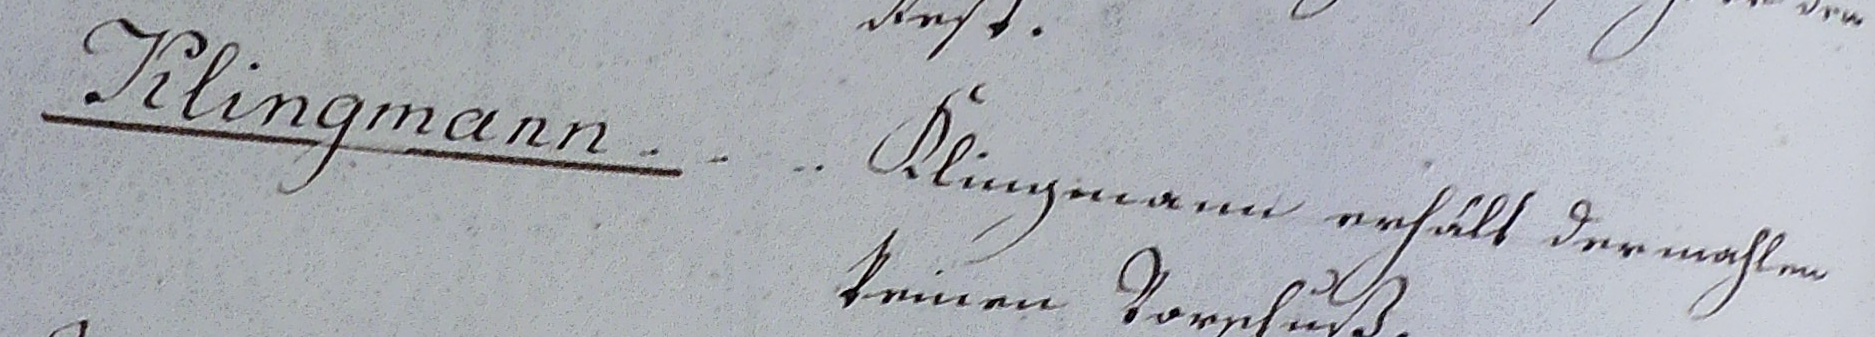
Klingmann .. .. .. Klingmann erhält der mahlen
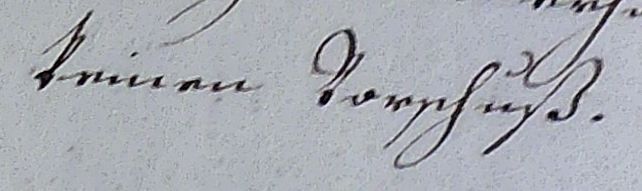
keinen Vorschuß.
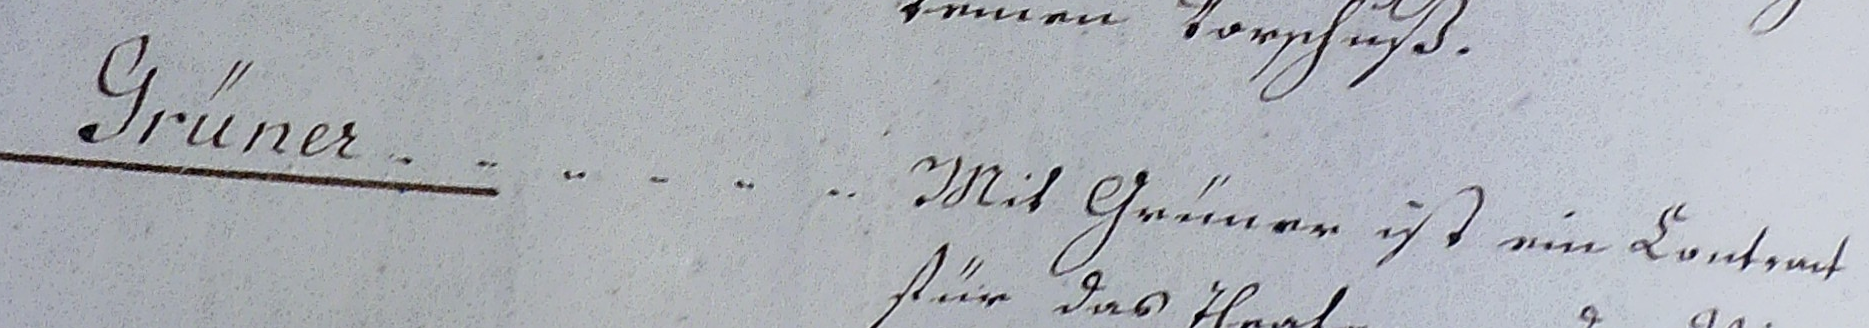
Grüner . .. .. .. .. .. Mit Grüner ist ein Contract
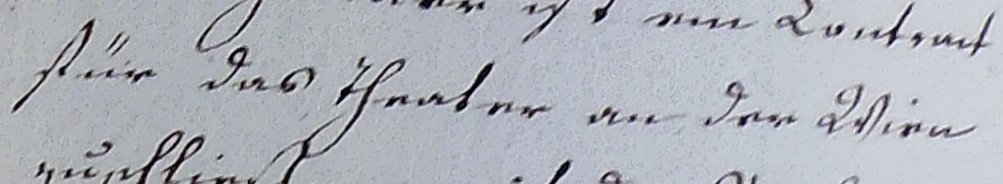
für das Theater an der Wien
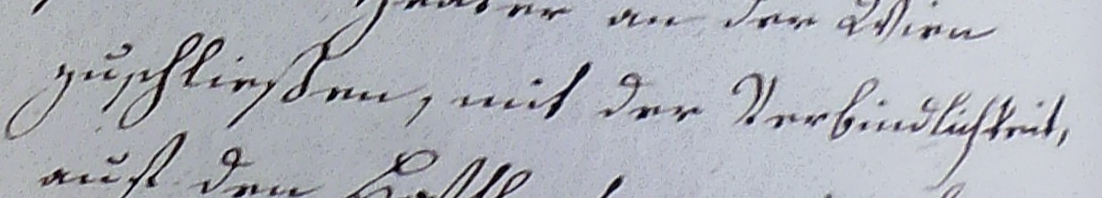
zuschließen, mit der Verbindlichkeit,
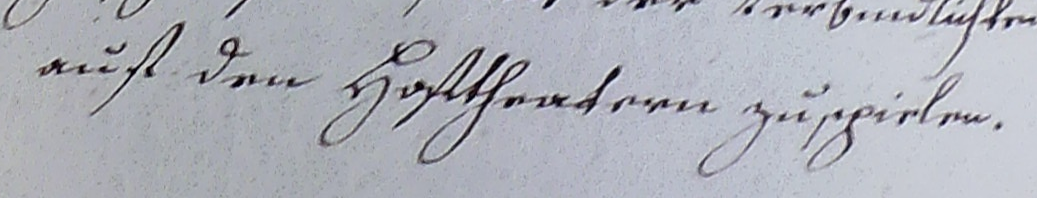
auf den Hoftheatern zuspielen.
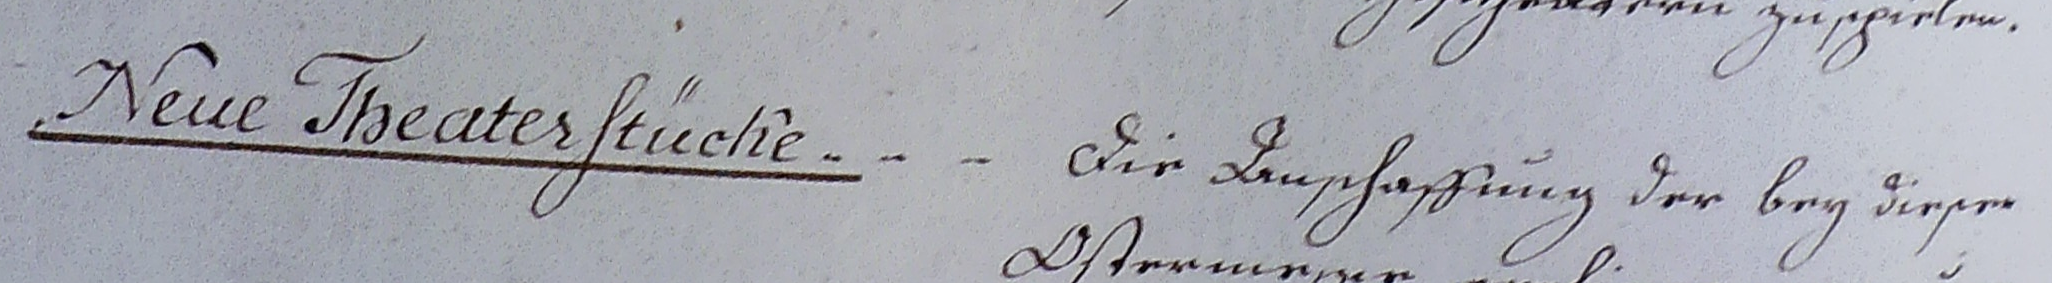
Neue Teaterstücke .. .. .. Die Anschaffung der bey dieser
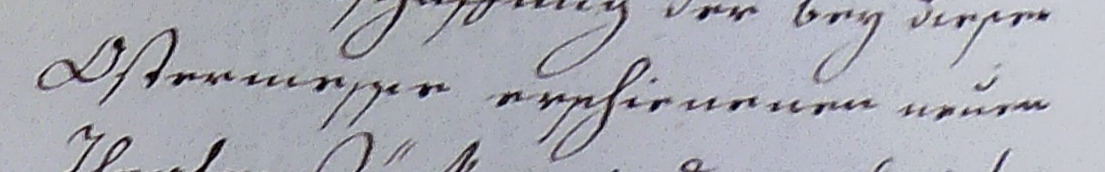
Ostermesse erschienenen neuen
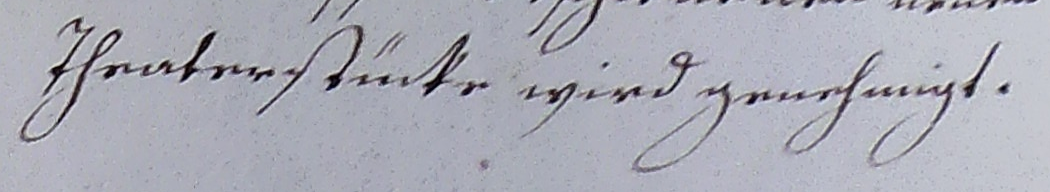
Theaterstücke wird genehmigt.
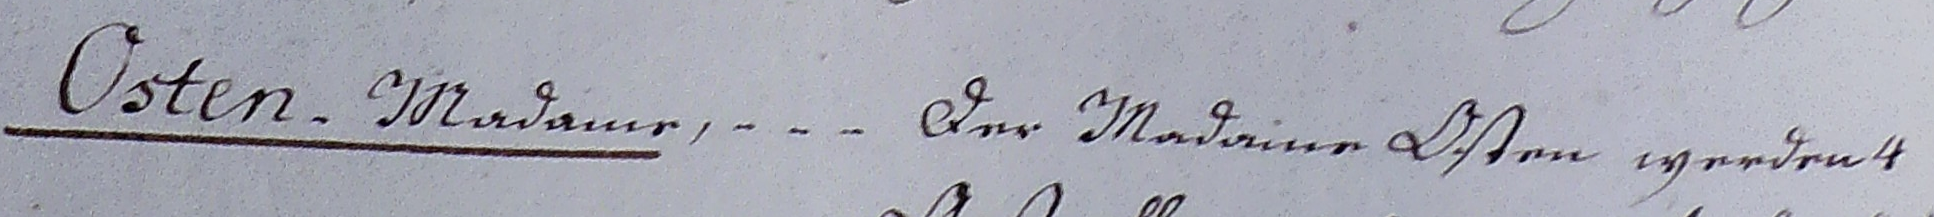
Osten. Madame, .. .. .. Der Madame Osten werden 4
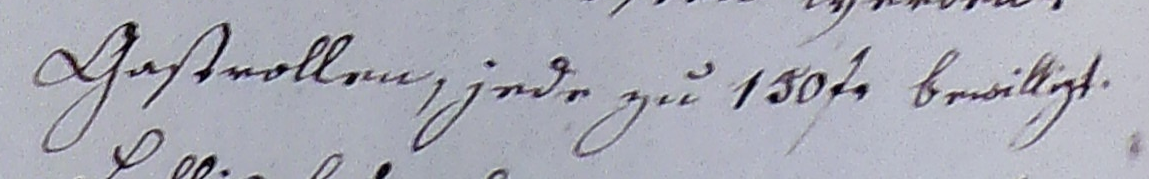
Gastrollen, jede zu 150r bewilligt.
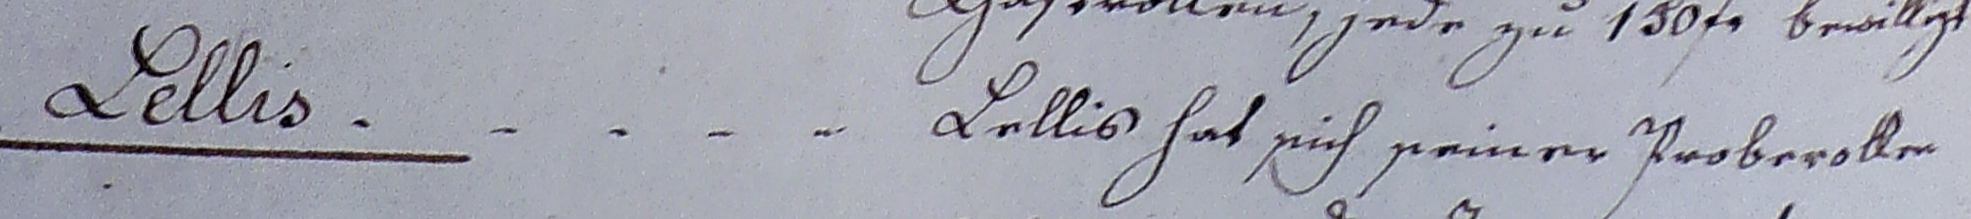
Lellis .. .. .. .. .. Lellis hat sich seiner Proberollen
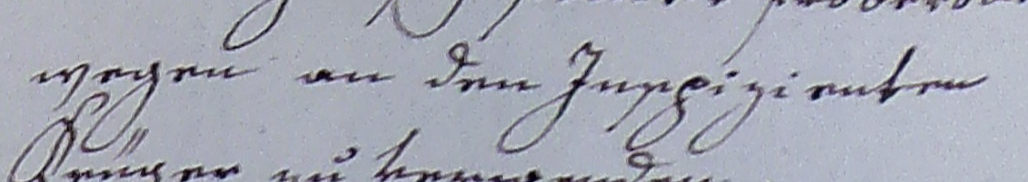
wegen an den Inspizienten
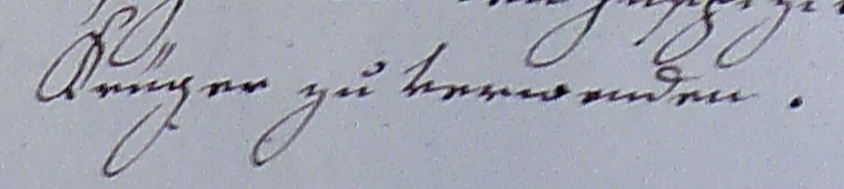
Krüger zu verwenden.
